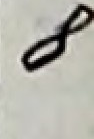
8
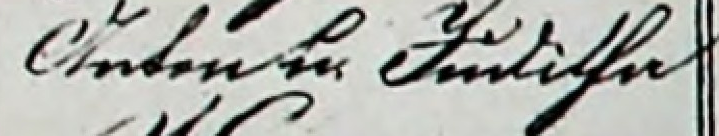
Anten u. Juditha
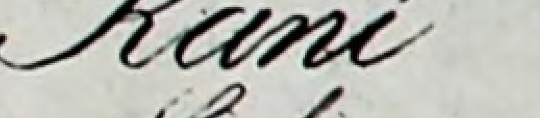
Kani
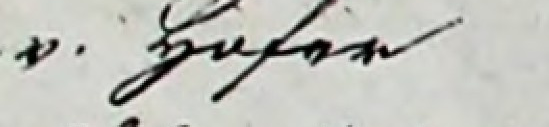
v. Hofer
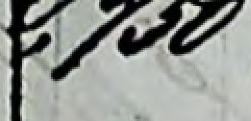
0,750
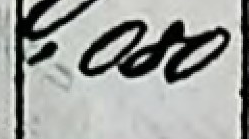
0,080
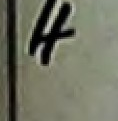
4
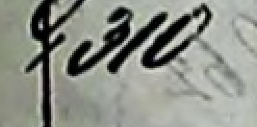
0,310
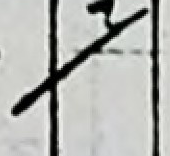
7
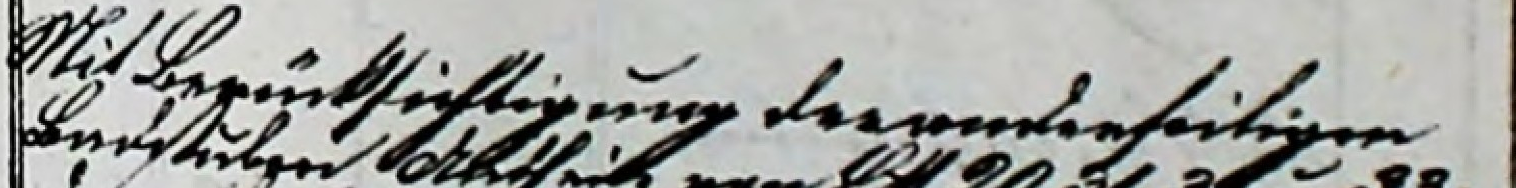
Mit Berücksichtigung der anderseiligen
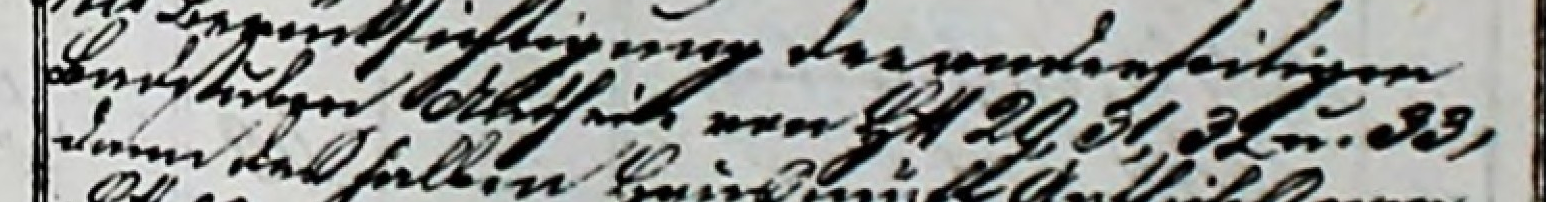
Badstuben Antheiles von H? 29, 31, 32 u. 33,
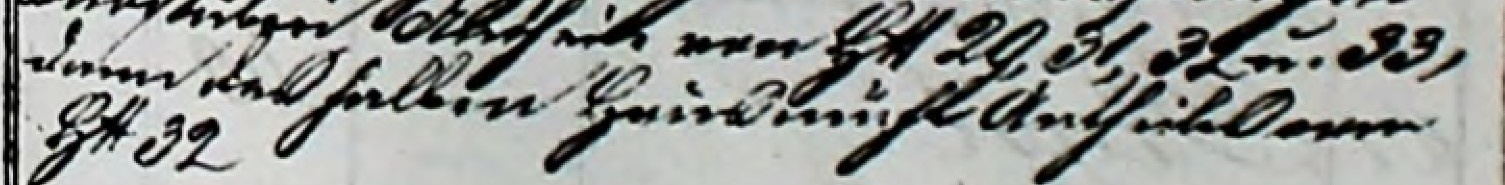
dann des halben Hausmühl Antheiles von
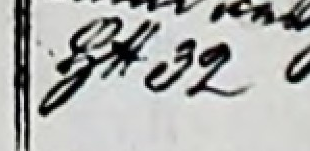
H? 32
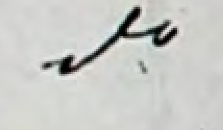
do
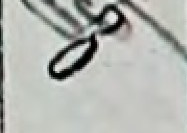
8
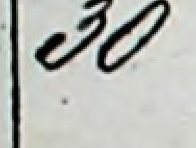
30
